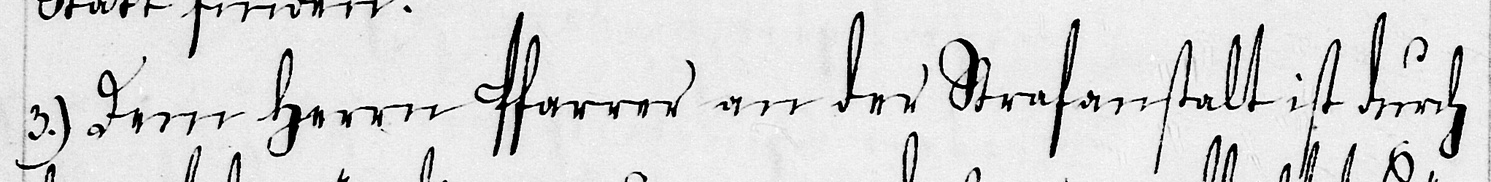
3.) Dem Herrn Pfarrer an der Strafanstalt ist durch
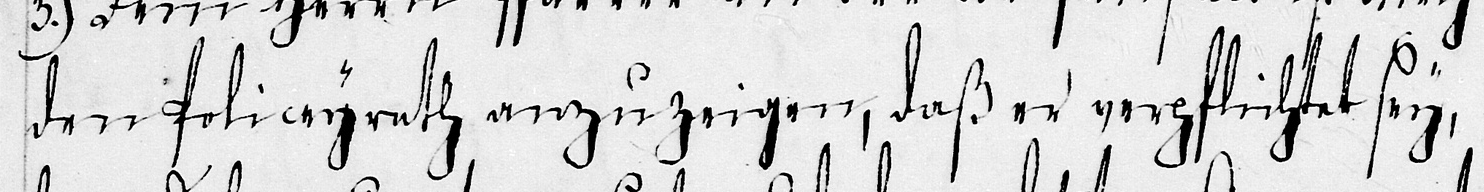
den Policeyrath anzuzeigen, daß er verpflichtet sey,
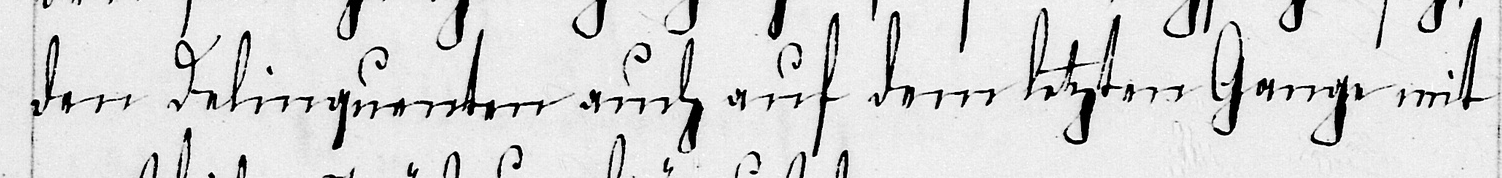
den Delinquenten auch auf dem letzten Gange mit
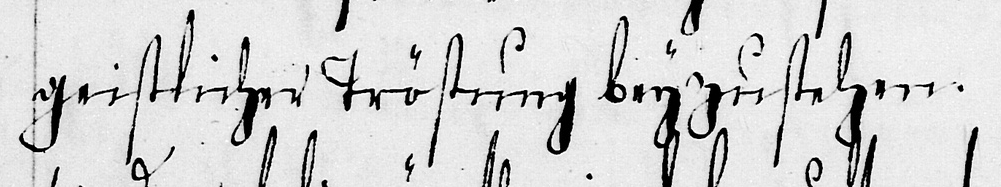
geistlicher Tröstung beyzustehen.
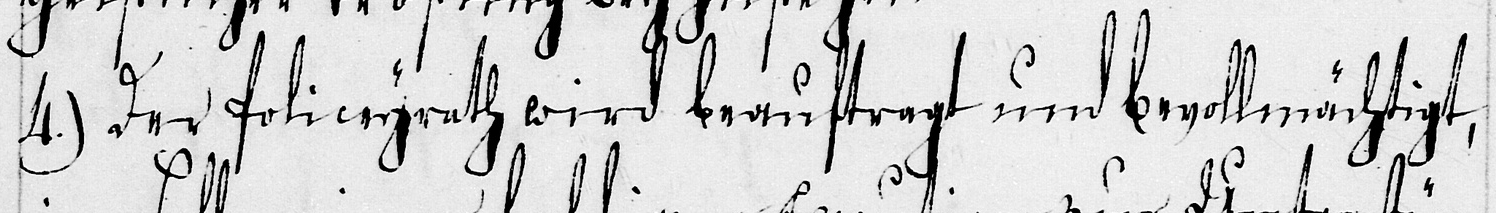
4.) Der Policeyrath wird beauftragt und bevollmächtig¬
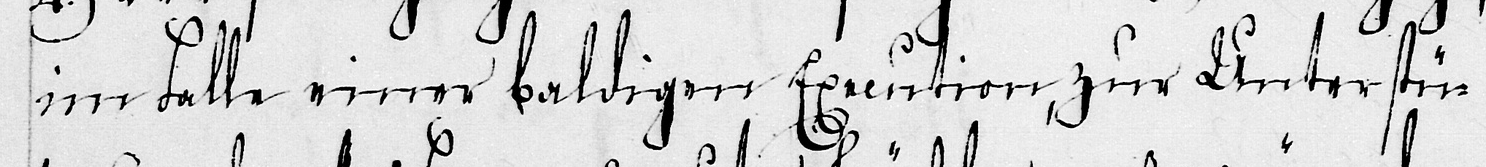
im Falle einer baldigen Execution, zur Unterstü¬
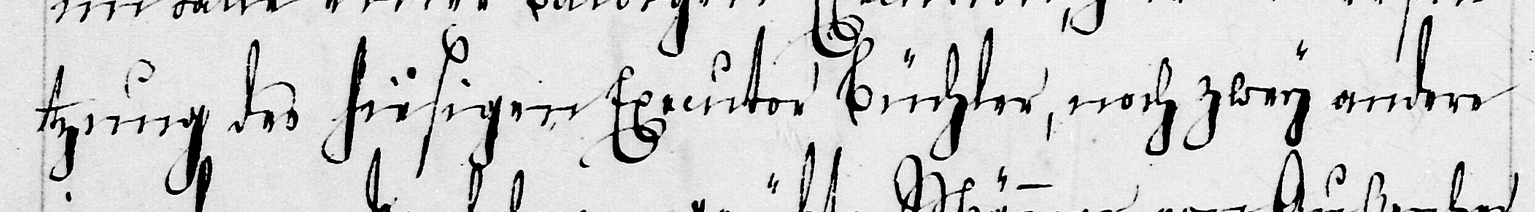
tzung des hiesigen Executor Büchler, noch zwey andere
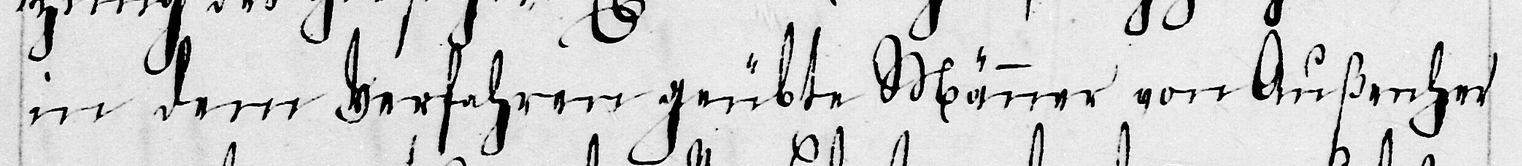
in dem Verfahren geübte Männer von Außenher
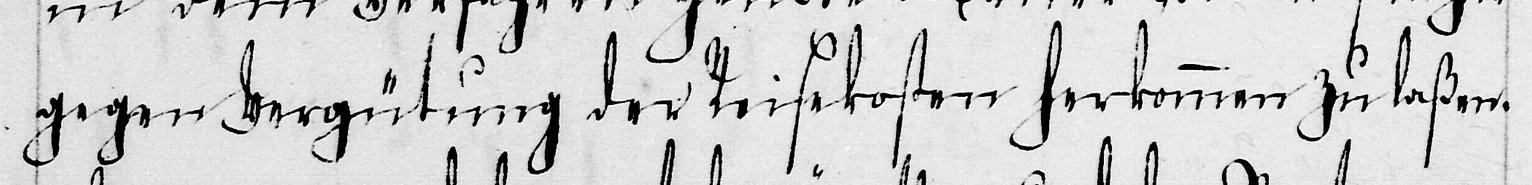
gegen Vergütung der Reisekosten herkommen zu laßen.
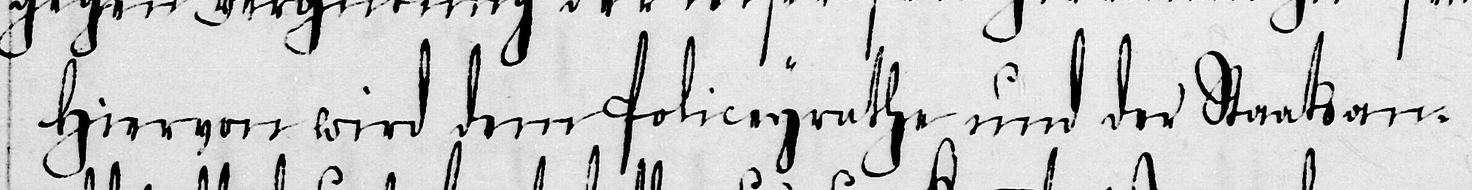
Hiervon wird dem Policeyrathe und der Staatsan¬
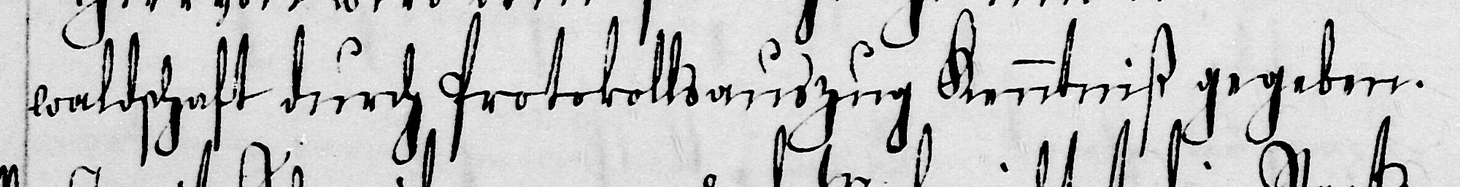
waldschaft durch Protokollsauszug Kenntniß gegeben.
